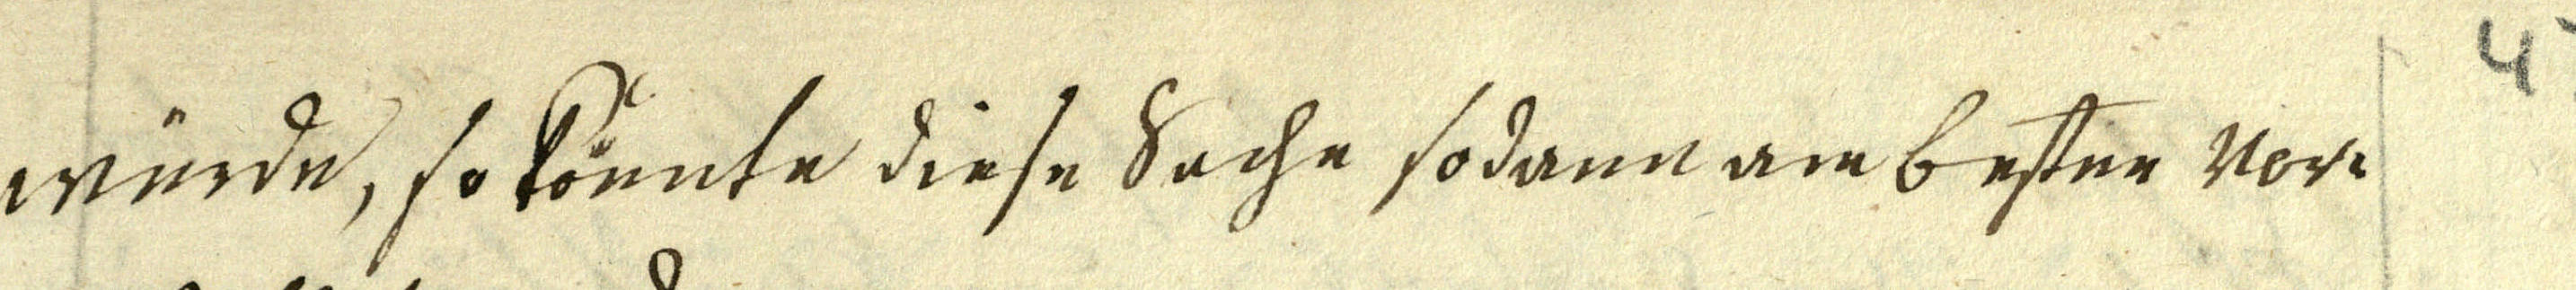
würde, so könnte diese Sache sodann am besten vor¬
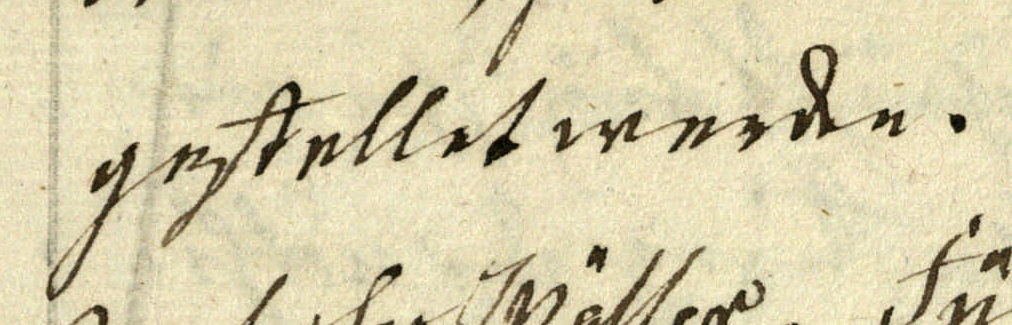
gestellet werden.
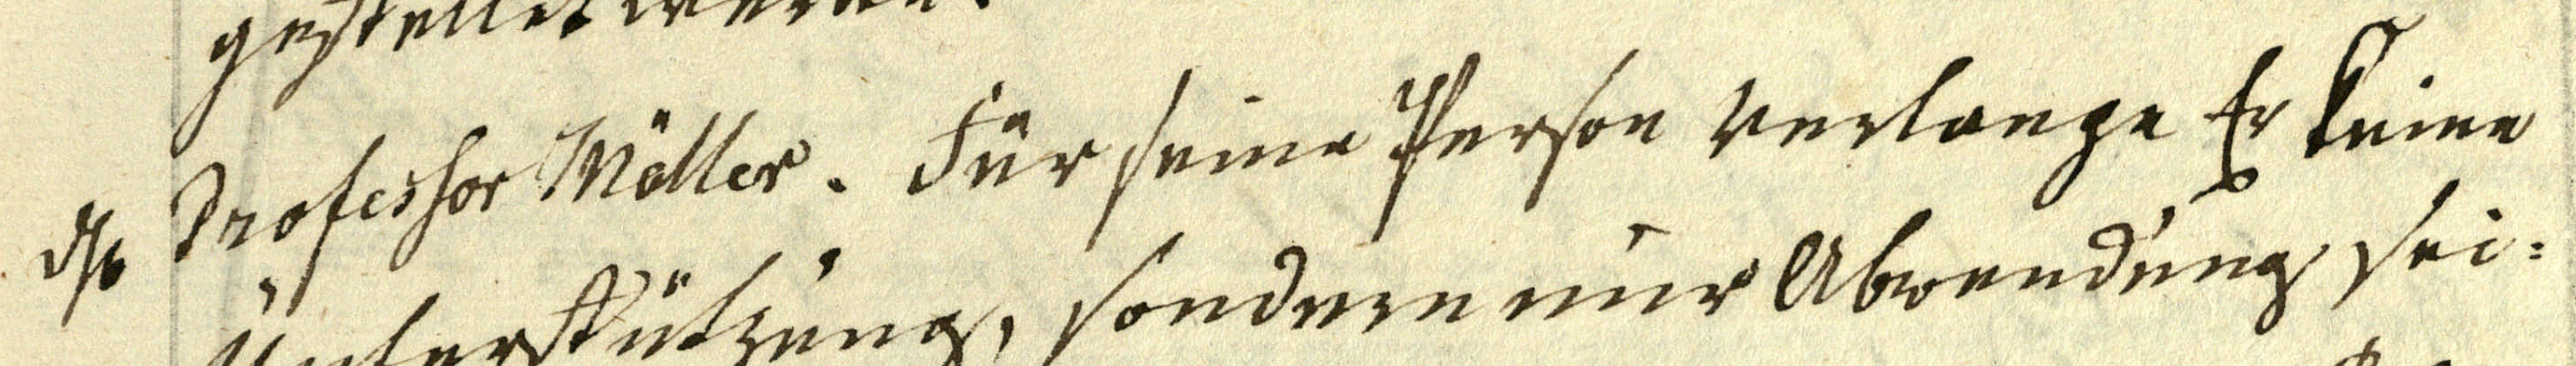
dh Professor Möller. Für seine Person verlange Er keine
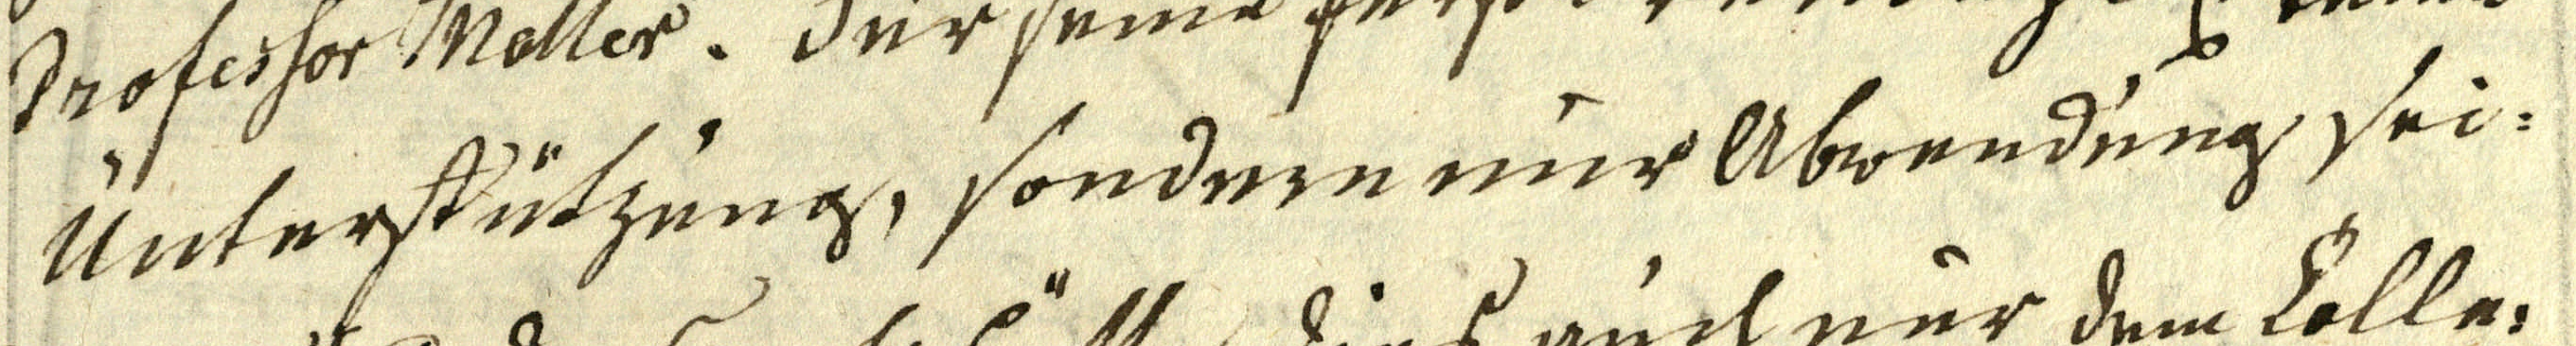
Unterstützung, sondern nur Abwendung sei¬
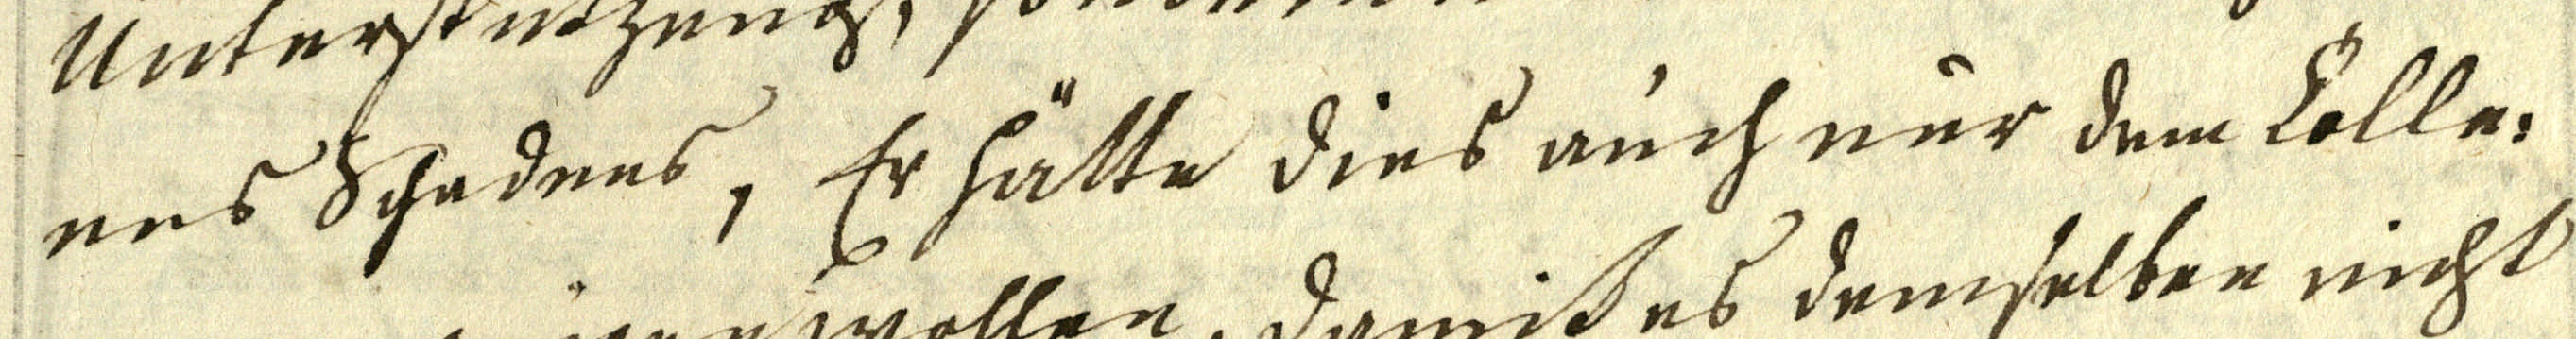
nes Schadens, Er hätte dies auch nur dem Colle¬
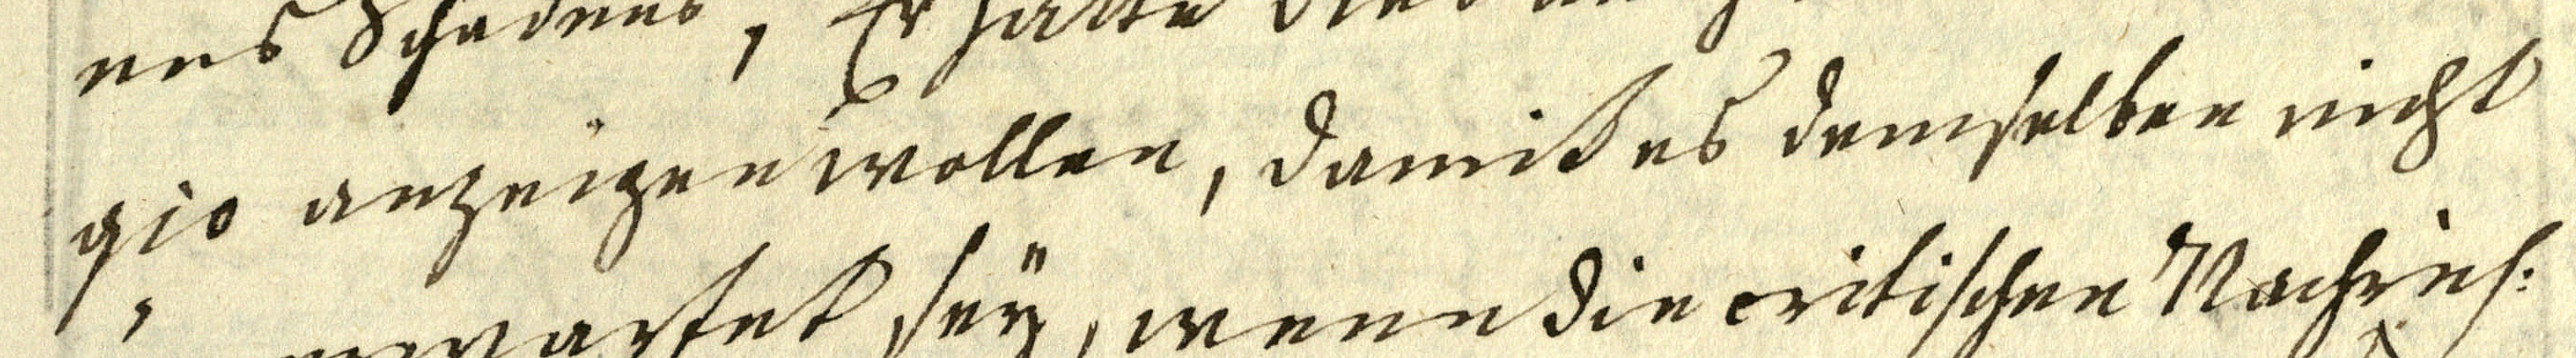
gio anzeigen wollen, damit es demselben nicht
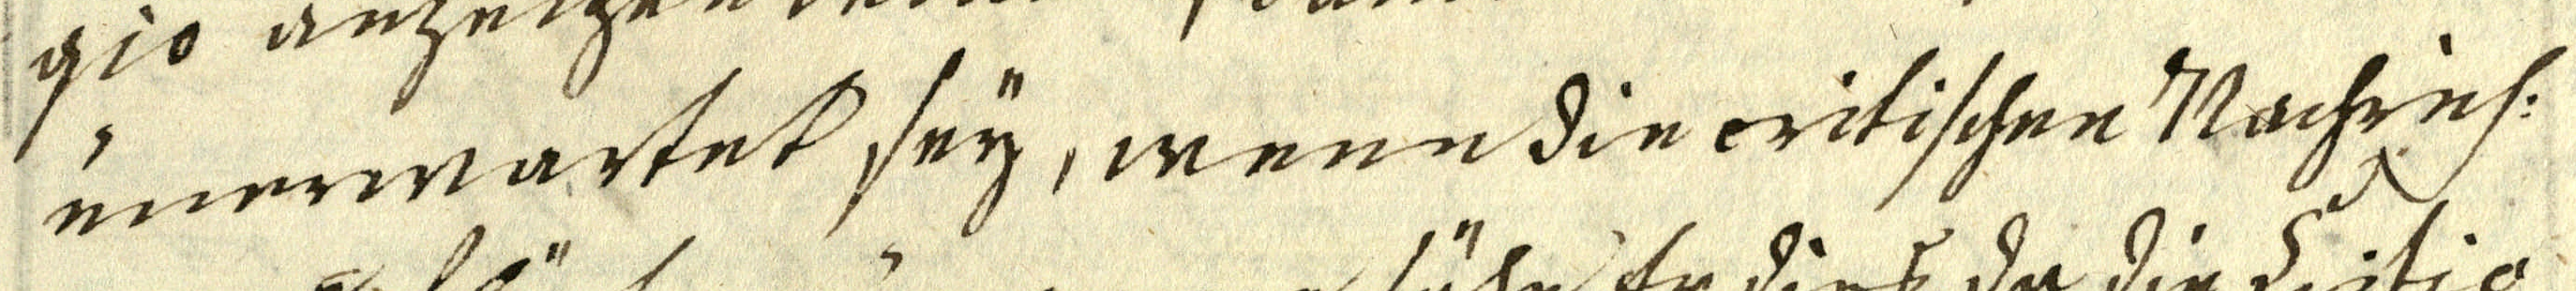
unerwartet seÿ, wenn die critischen Nachrich¬
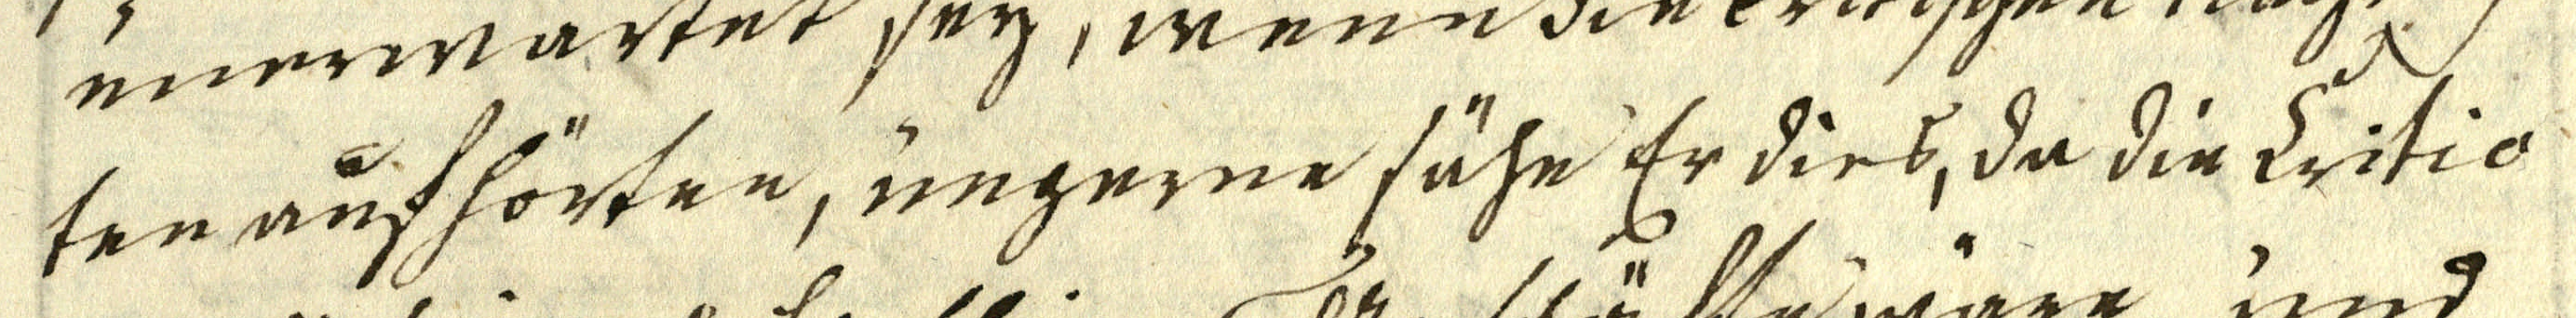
ten aufhörten, ungerne sähe Er dies, da die Critio
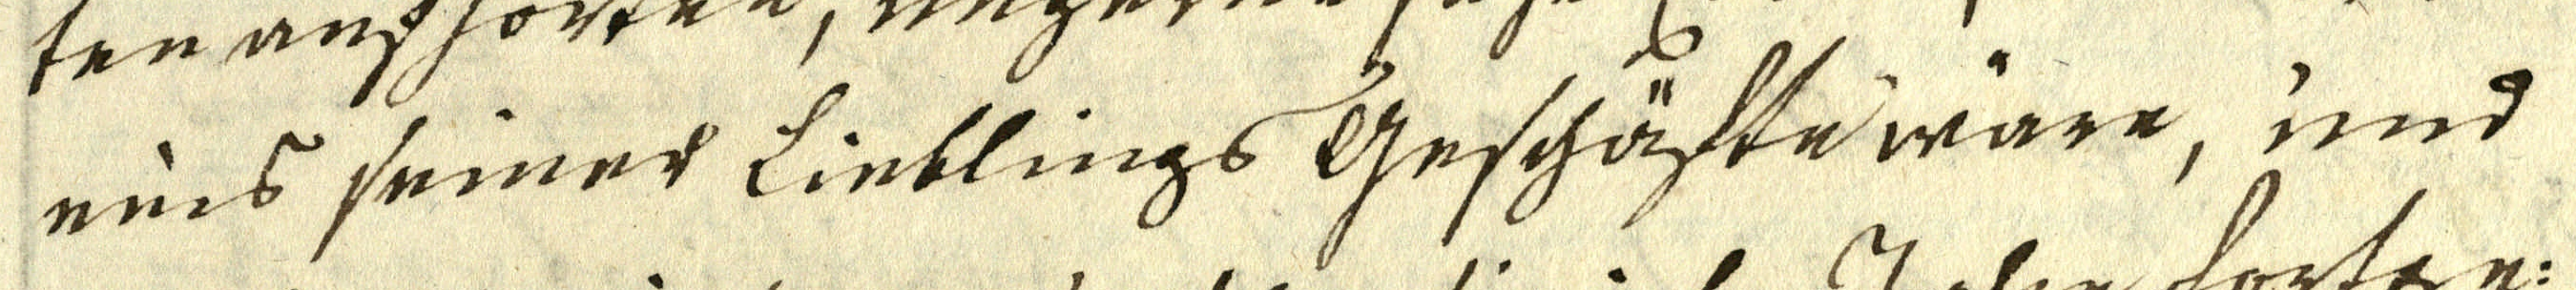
eines seiner Lieblings Geschäfte wäre, und
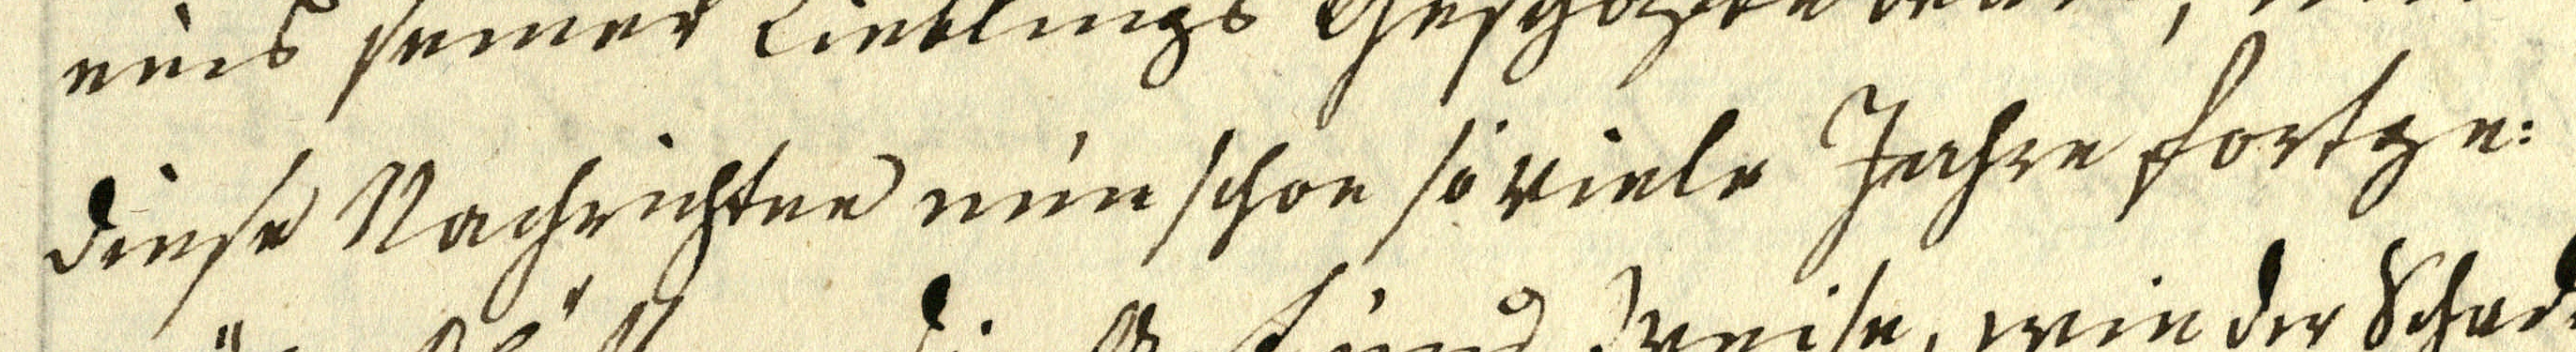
diese Nachrichten nun schon so viele Jahre fortge¬
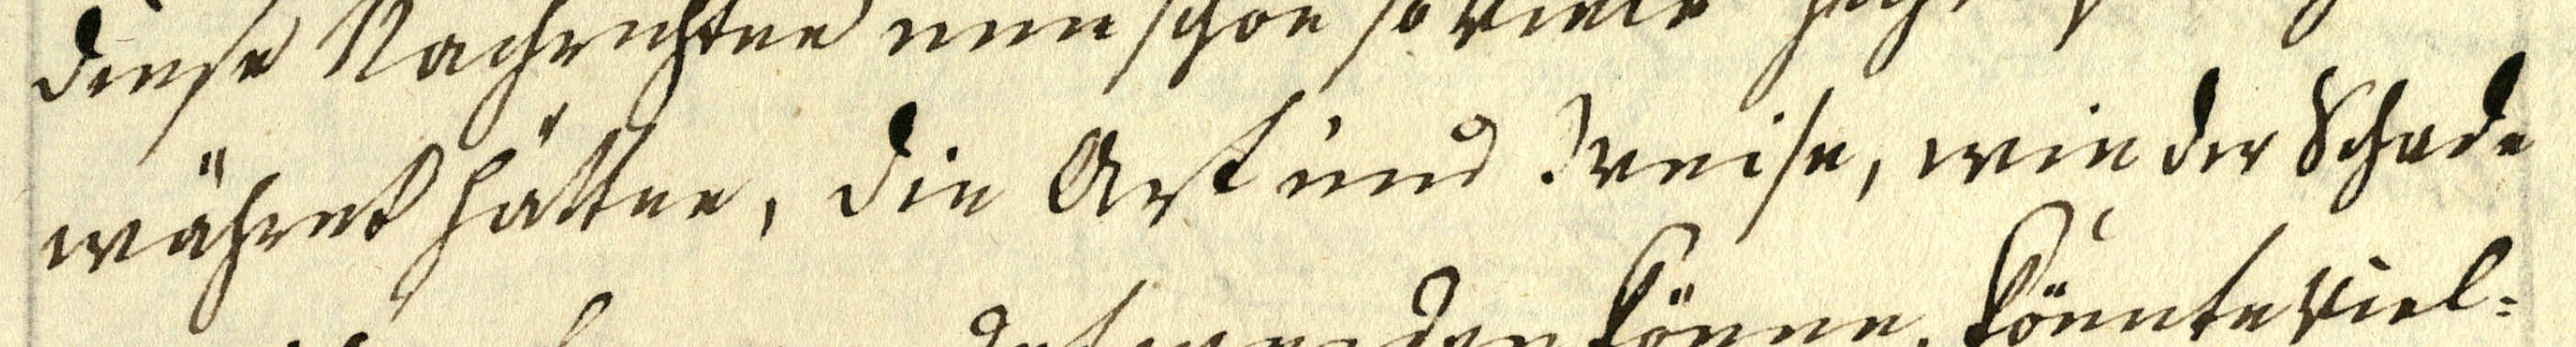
währet hätten, die Art und Weise, wie der Schade
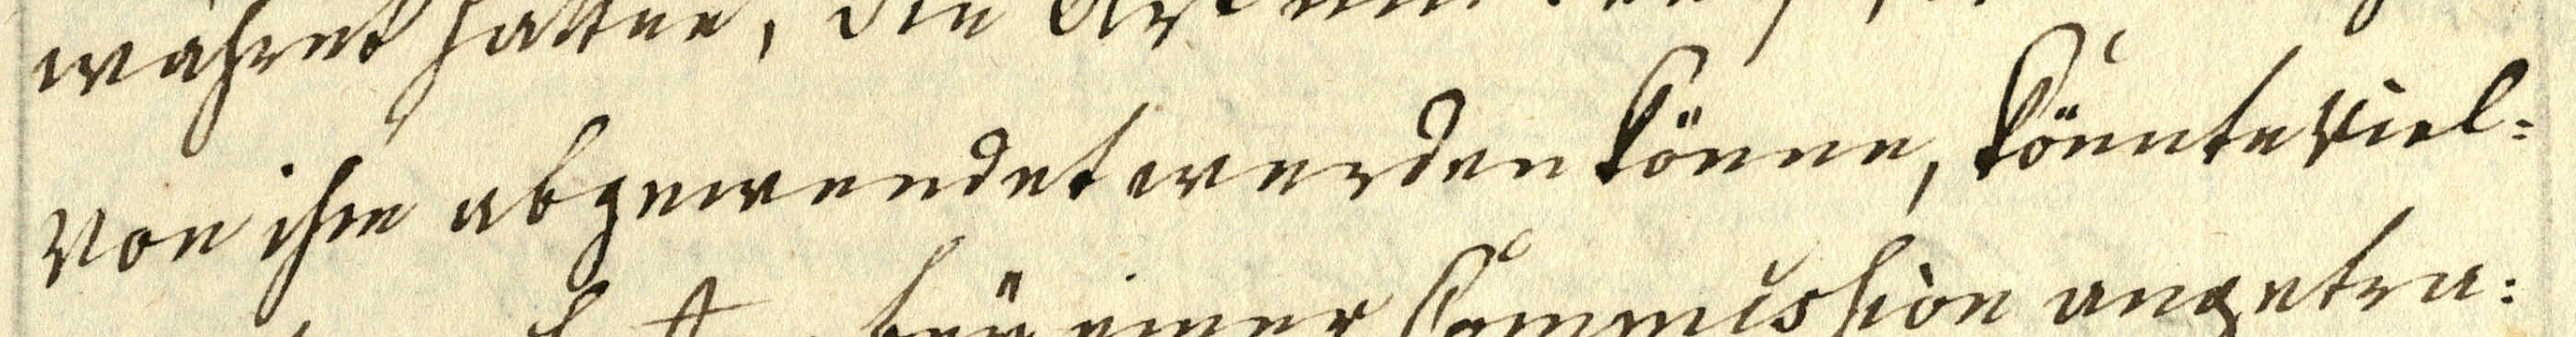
von ihm abgewendet werden könne, könnte viel¬
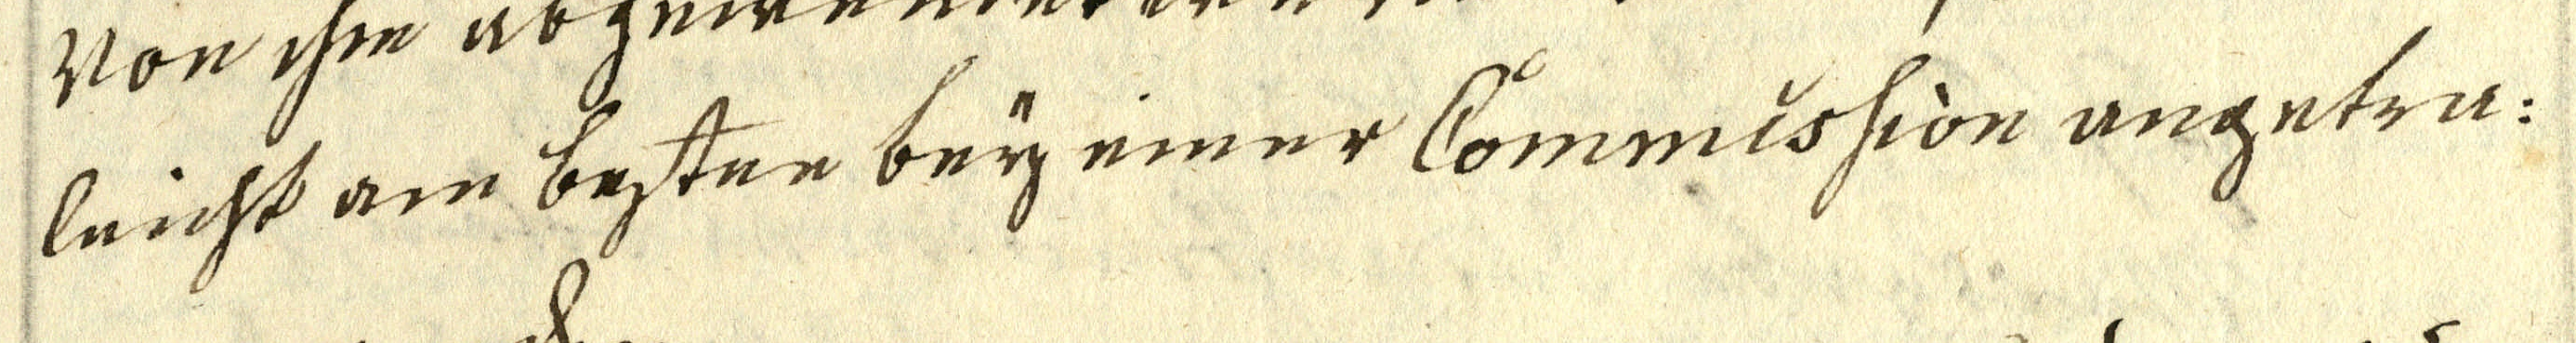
leicht am besten beÿ einer Commission angetra¬
